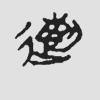{辶叀刀}
